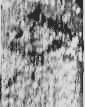宋
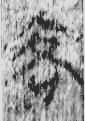客
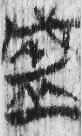盛
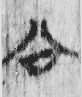公
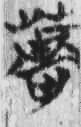○（聘）
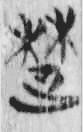楚
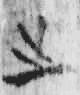之
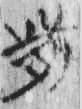歲（歲）
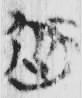○（屈）
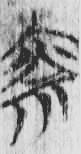○（夕）
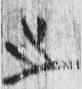之
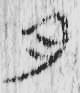月
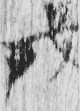戊
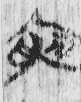寅
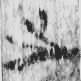之
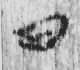日
